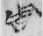周
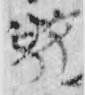敓
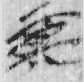奠
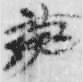黃
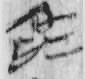爲
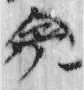○（賓）
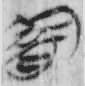酓（熊）
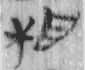相
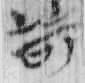苛
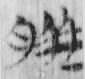胼
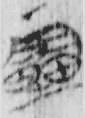雷
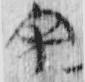牢
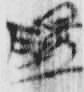○（陽）
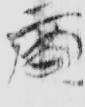晨
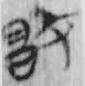敢
